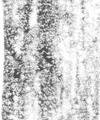之
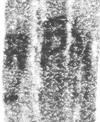綳
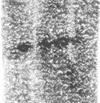一
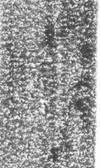革
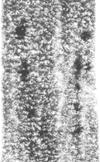○（帶）
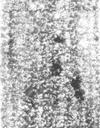又（有）
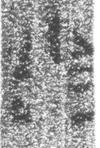金
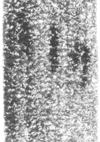鉤
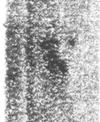亓（其）
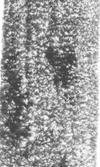○（佩）
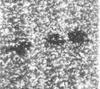一
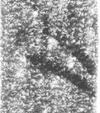少（小）
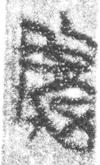鐶（環）
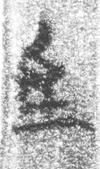○（徑）
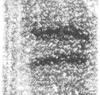二
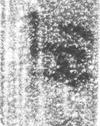灷（寸）
